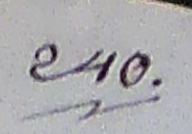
240.
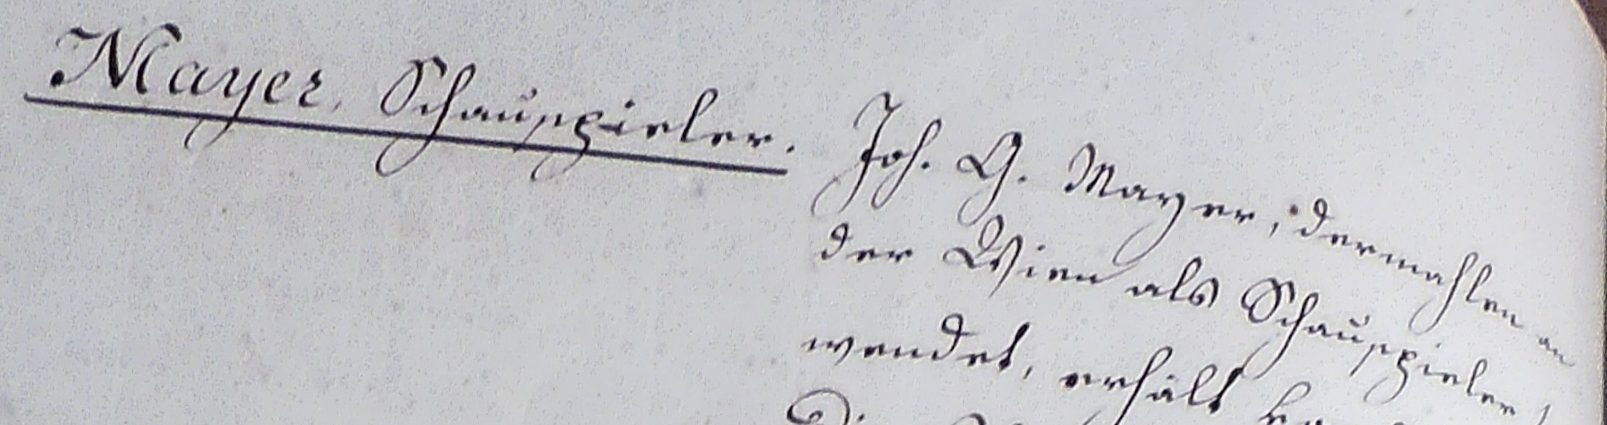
Mayer, Schauspieler. Joh. G. Mayer ,dermahlen an
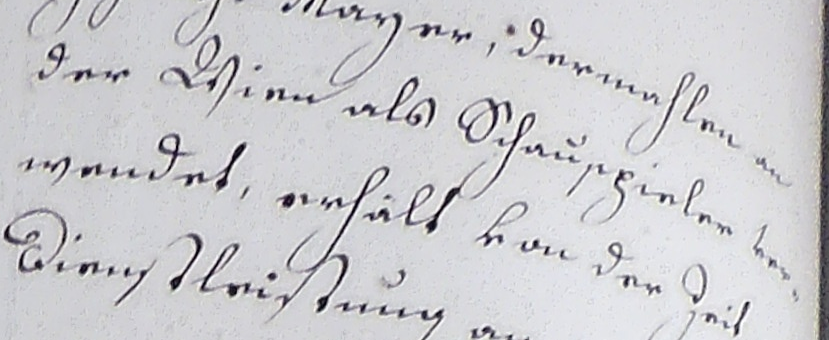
der Wien als Schauspieler ver¬
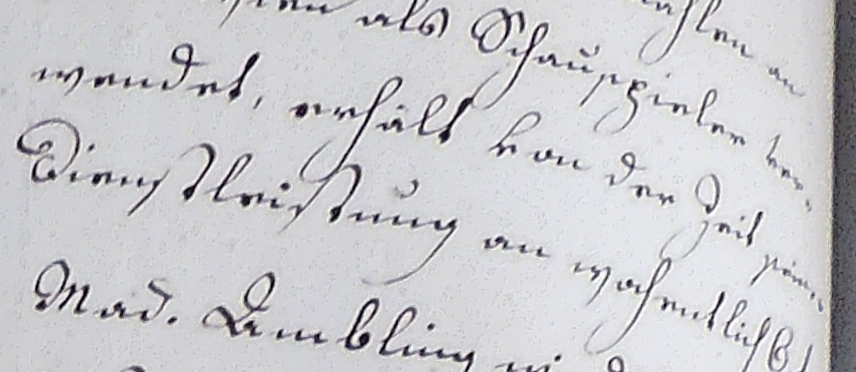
wendet, erhält von der Zeit seiner
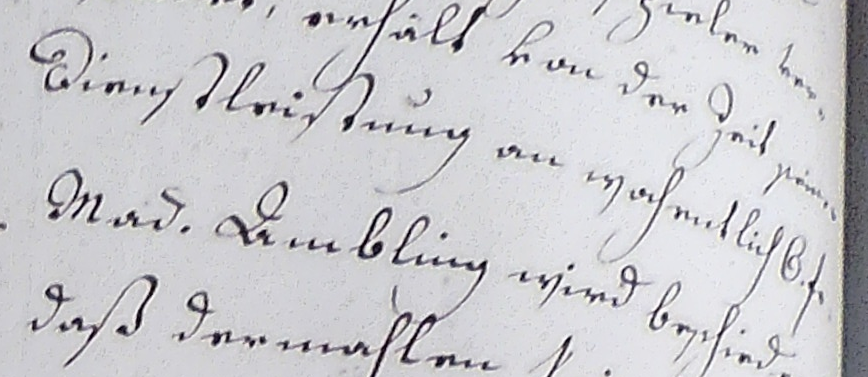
Dienstleistung an wochentlich 6 fr.
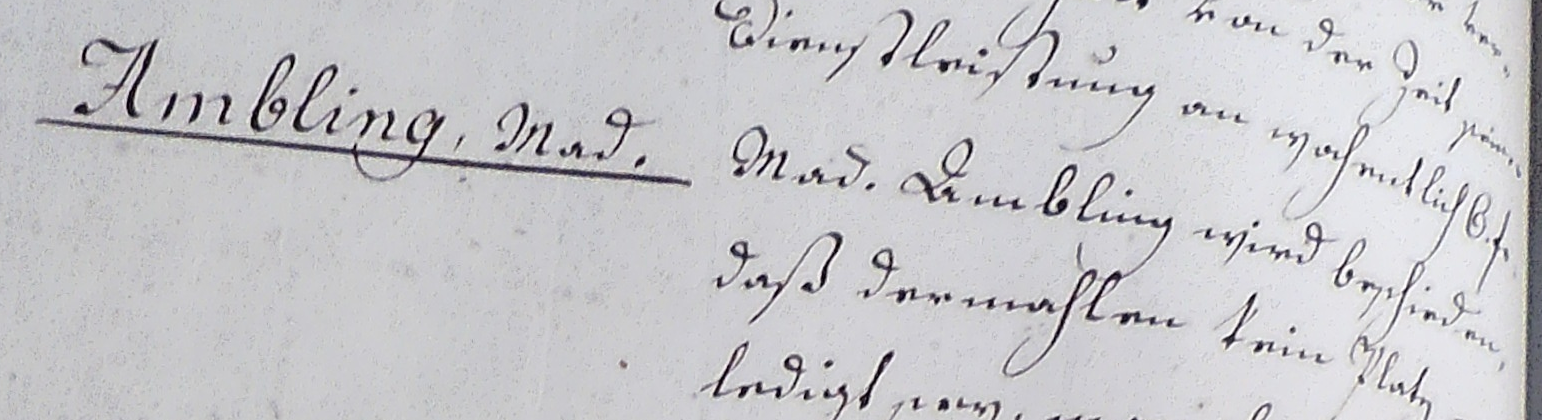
Ambling, Mad. Mad. Ambling wird beschieden,
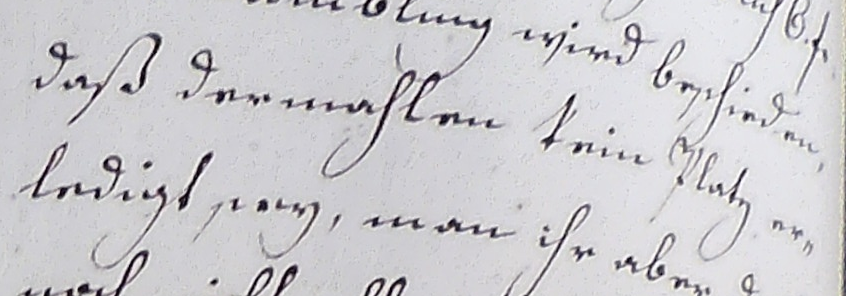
daß dermahlen kein Platz er¬
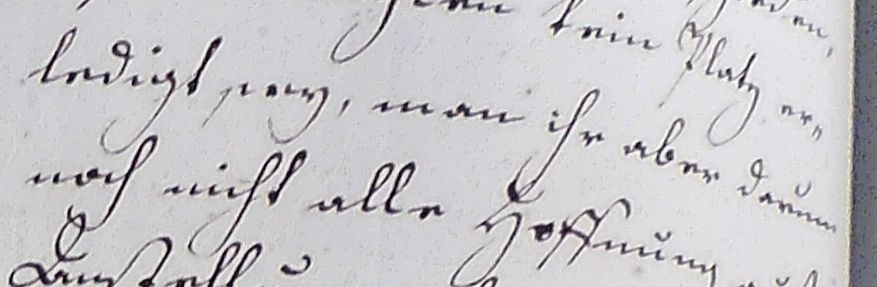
ledigt sey, man ihr aber darum
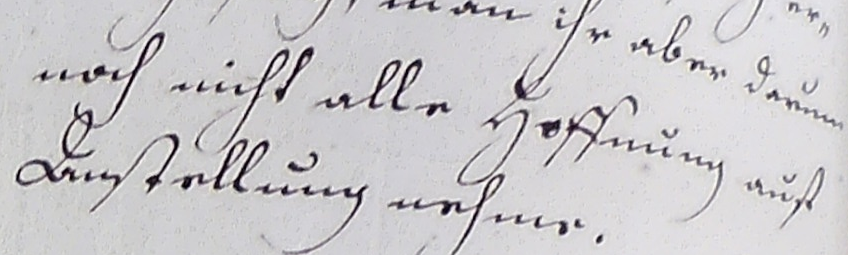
noch nicht alle Hoffnung auf
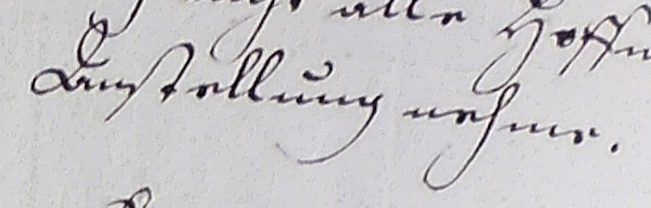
Anstellung nehme.
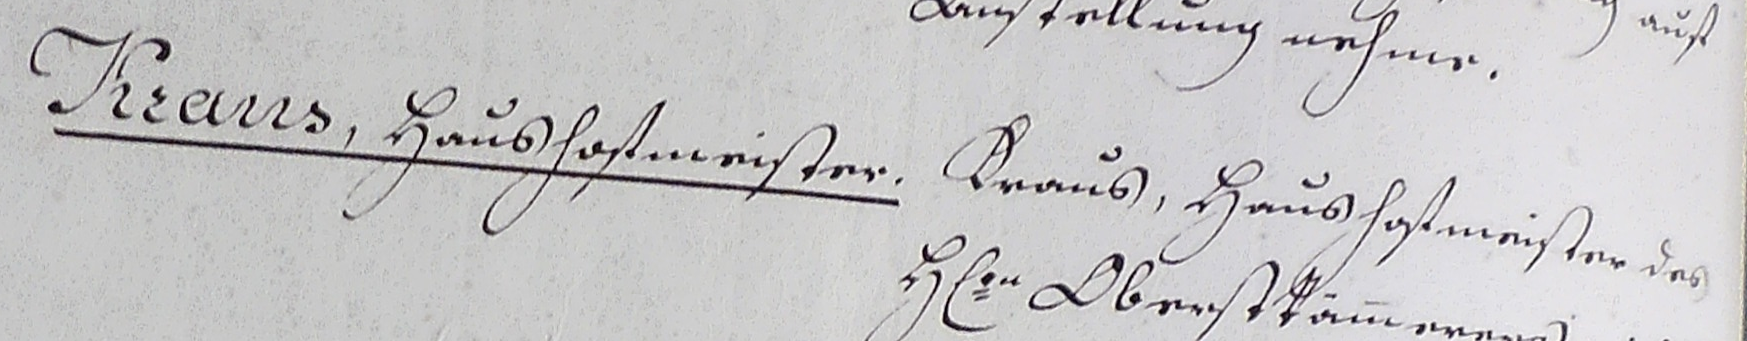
Kraus, Haushofmeister. Kraus, Haushofmeisten des
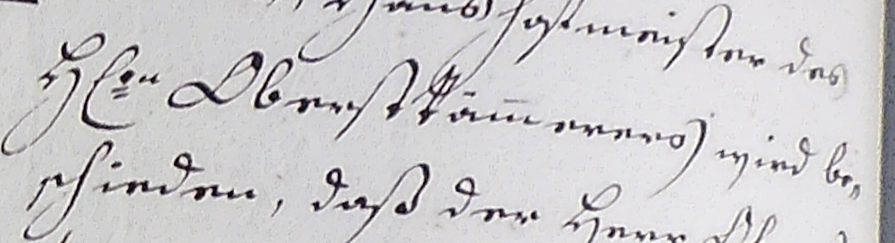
HEr͇n Oberstkäm̅erers wird be¬
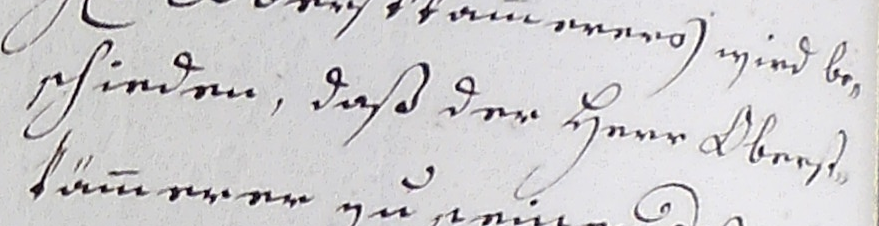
schieden, daß der Herr Oberst¬
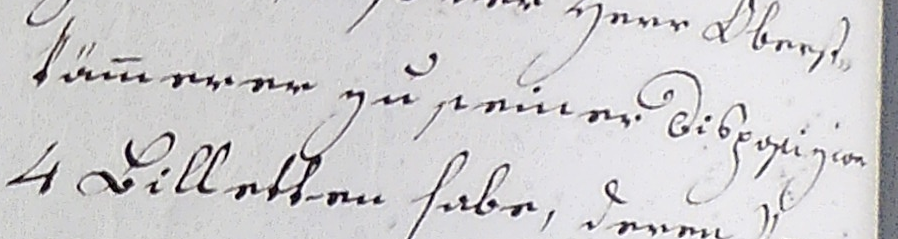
käm̅erer zu seiner Disposizion
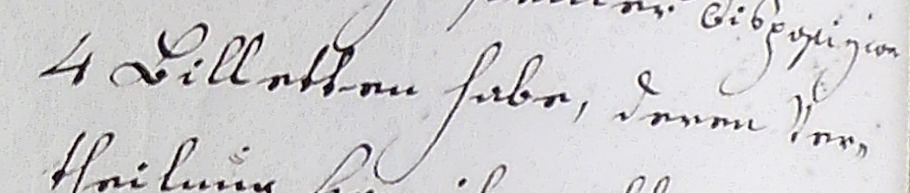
4 Billetten habe, deren Ver¬
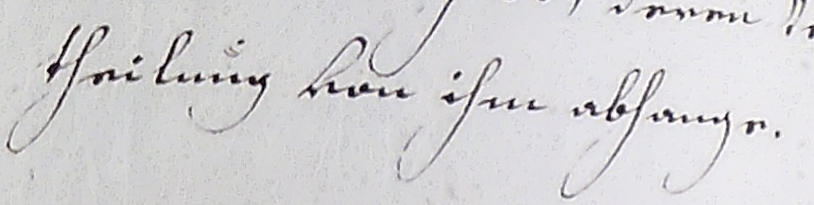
theilung von ihm abhange.
